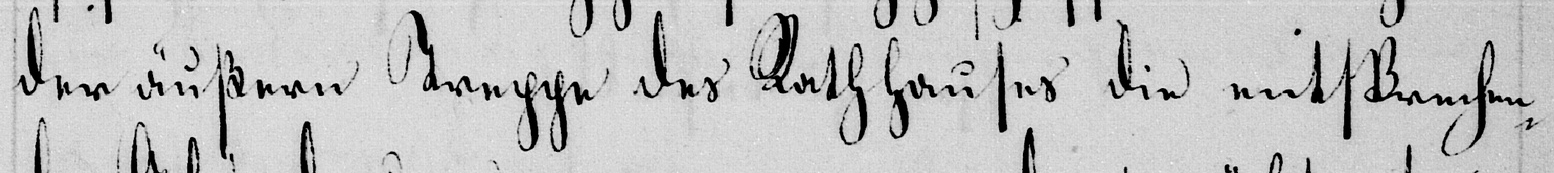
der äußern Treppe des Rathhauses die entsprechen¬
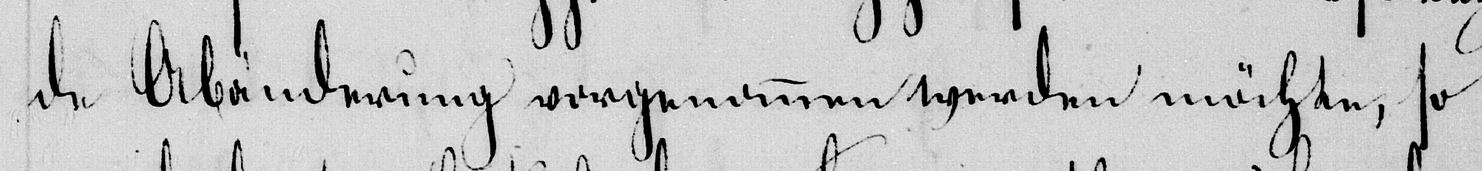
de Abänderung vorgenommen werden möchte, so
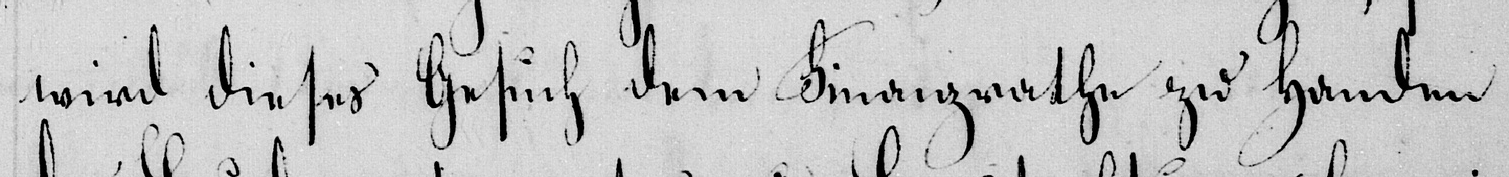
wird dieses Gesuch dem Finanzrathe zu Handen
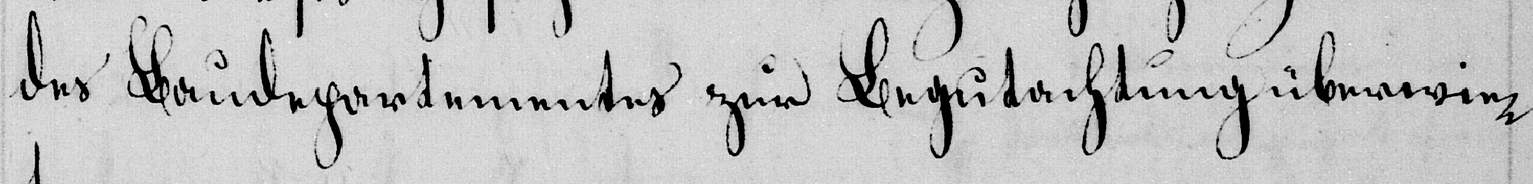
des Baudepartements zur Begutachtung überwie¬
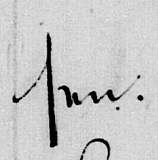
sen.
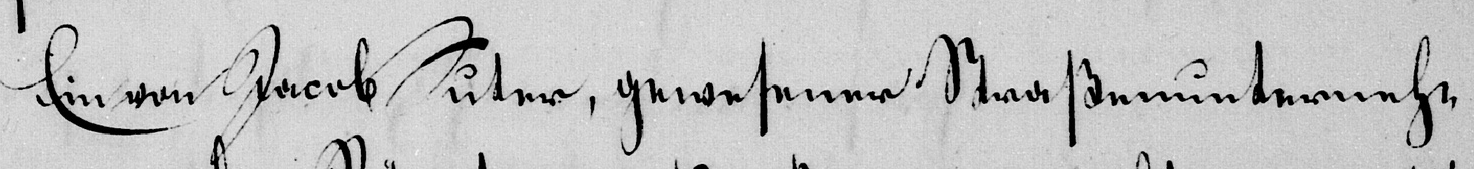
Ein von Jacob Suter, gewesener Straßenunterneh¬
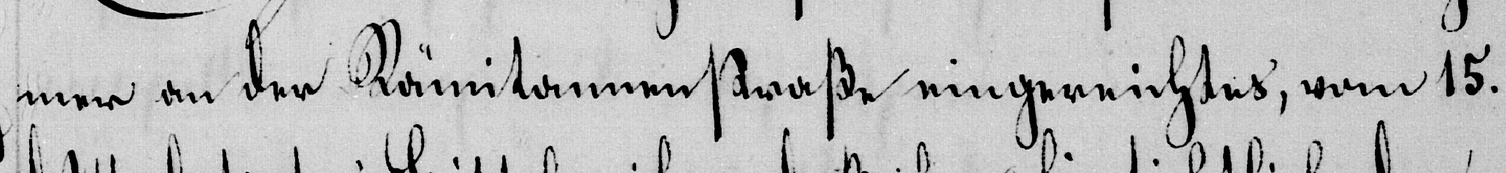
mer an der Rämitannenstraße eingereichtes, vom 15.
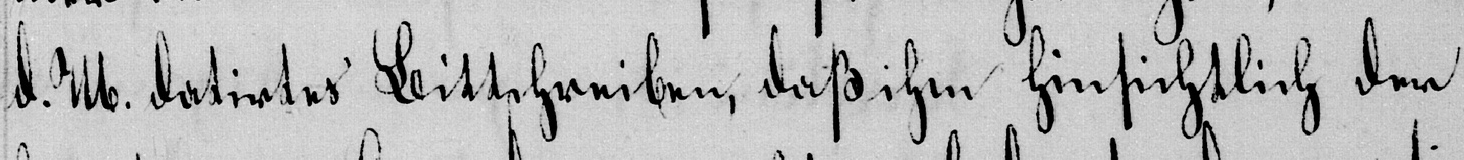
d. M. datirtes Bittschreiben, daß ihm hinsichtlich der
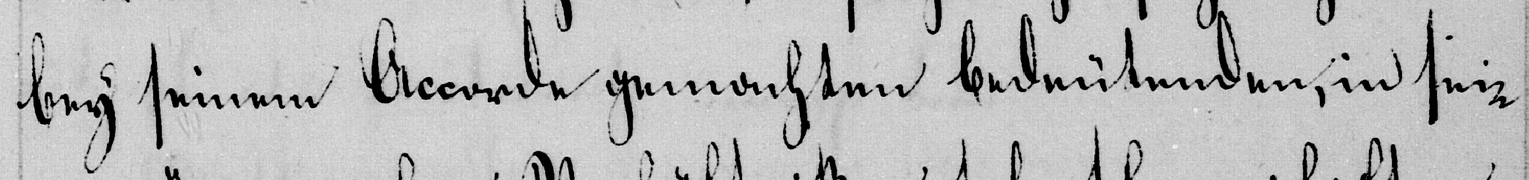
bey seinem Accorde gemachten bedeutenden, in sei¬
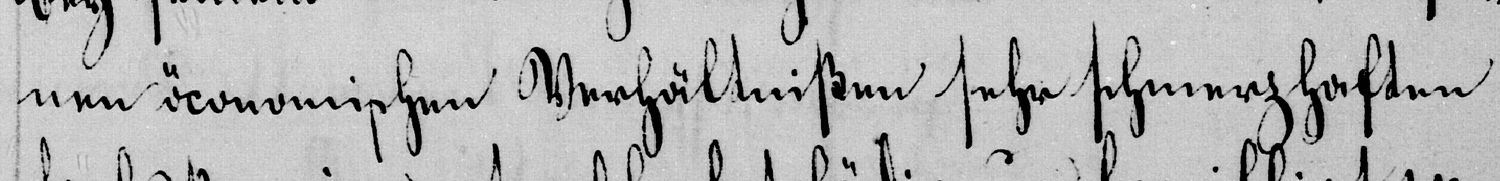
nen öconomischen Verhältnißen sehr schmerzhaften
